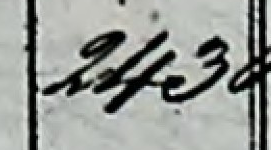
243
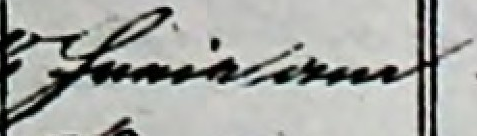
Freie am
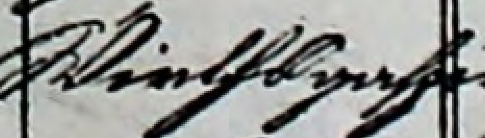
Wirthsgasper
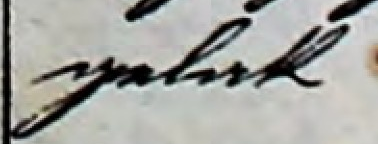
gelak
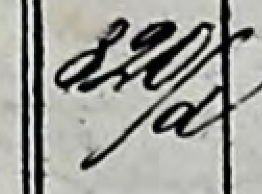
820/d
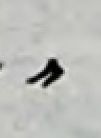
„
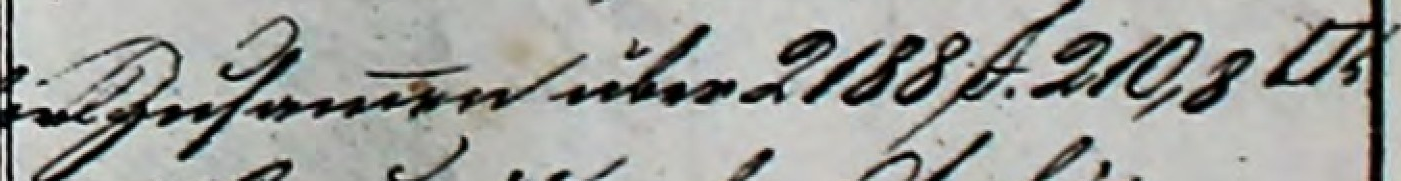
von ..... 73 „ 610,0„
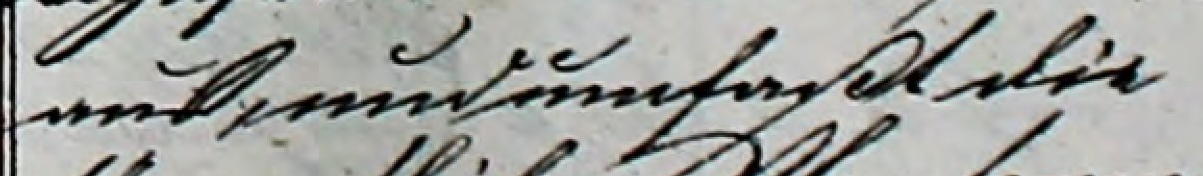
Zusammen über 2188 J. 210,8 K
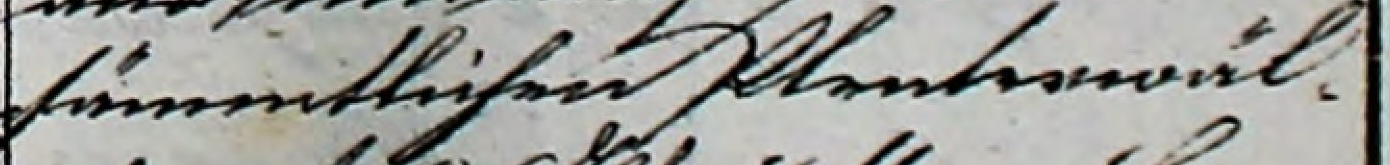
aus und umfaßt die
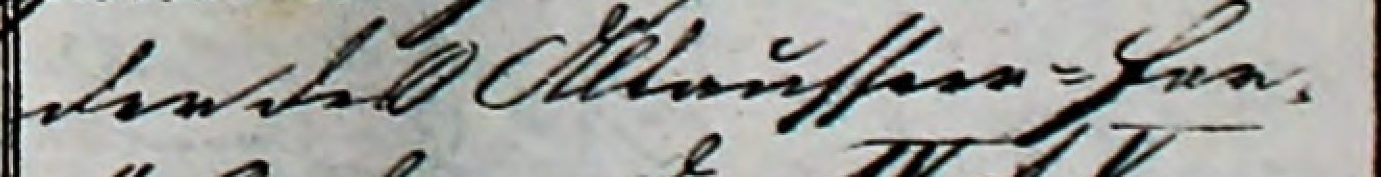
sämmtlichen Plenterwäl„
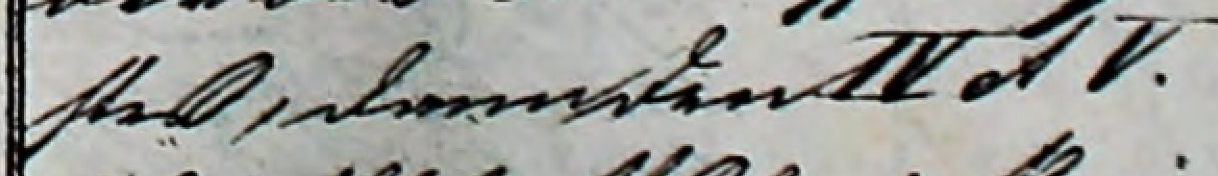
den des Altaussee=Her„
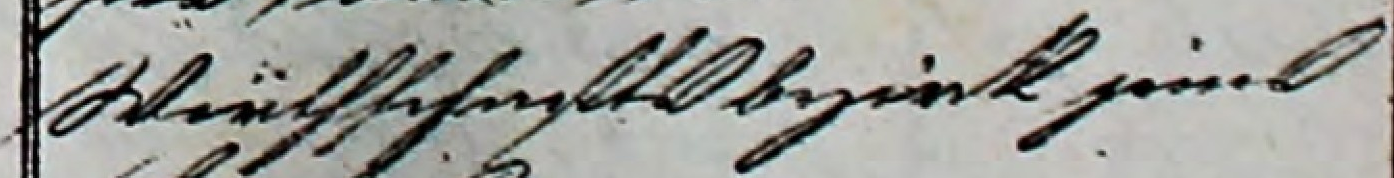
stes, dann den IV et V.
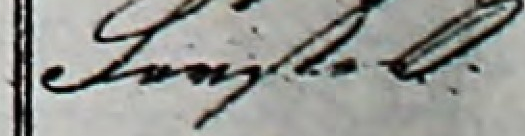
Wirthschaftsbezirk zins Forste?:
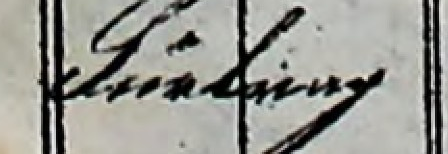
Fürtrag
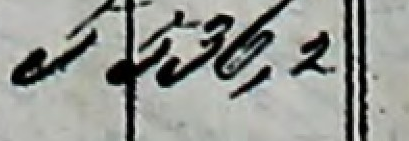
5536,2
